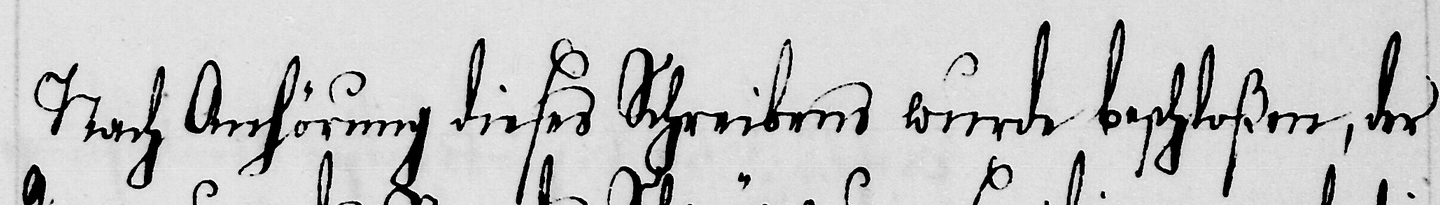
Nach Anhörung dieses Schreibens wurde beschloßen, der
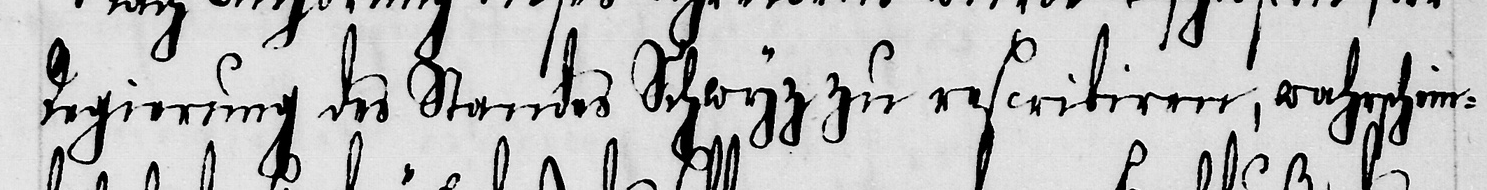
Regierung des Standes Schwyz zu rescribiren, wahrschein¬
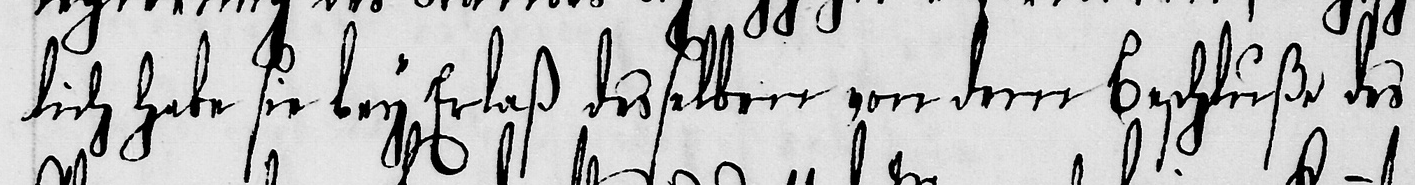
lich habe sie bey Erlaß desselben von dem Beschluße des
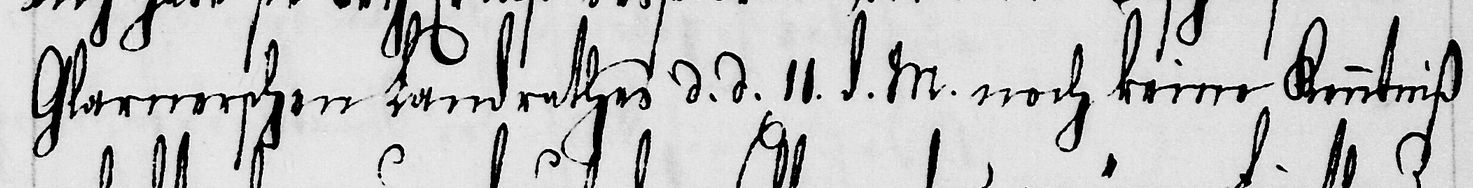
Glarnerschen Landrathes d. d. 11. d. M. noch keine Kenntniß
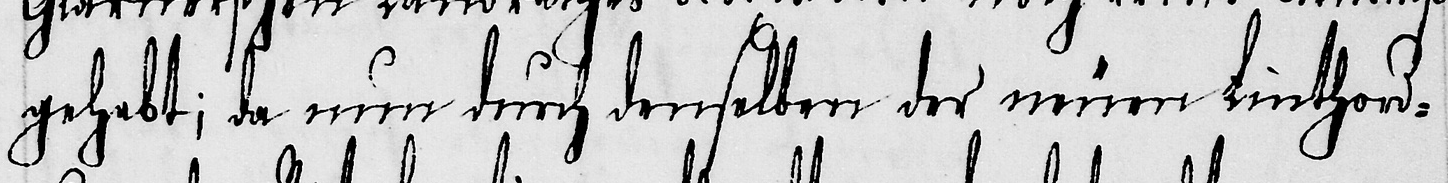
gehabt; da nun durch denselben der neuen Linthord¬
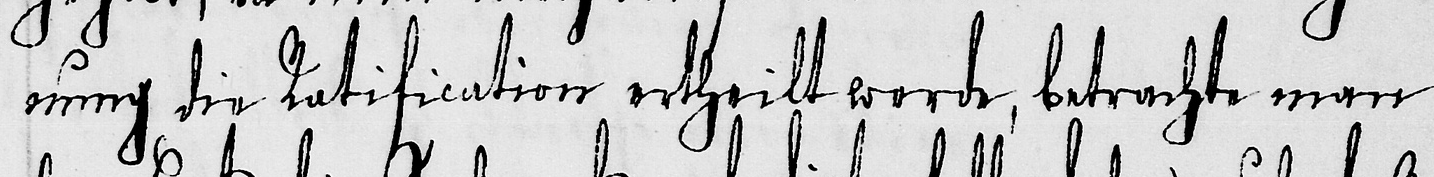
nung die Ratification ertheilt werde, betrachte man
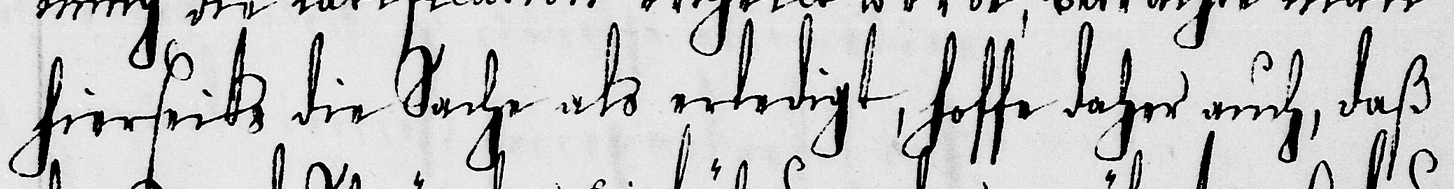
hierseits die Sache als erledigt, hoffe daher auch, daß
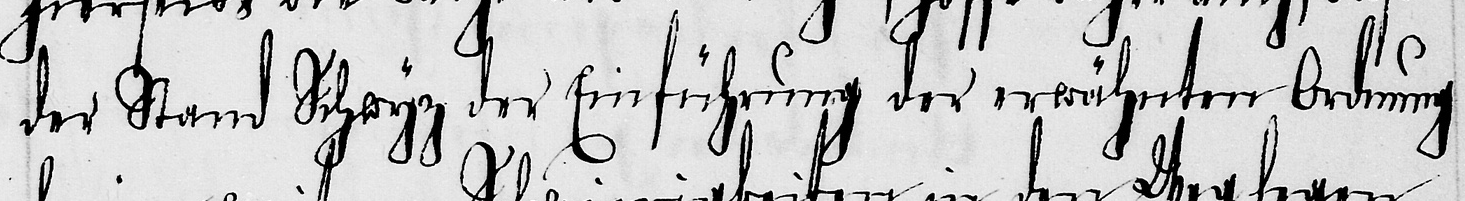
der Stand Schwyz der Einführung der erwähnten Ordnung
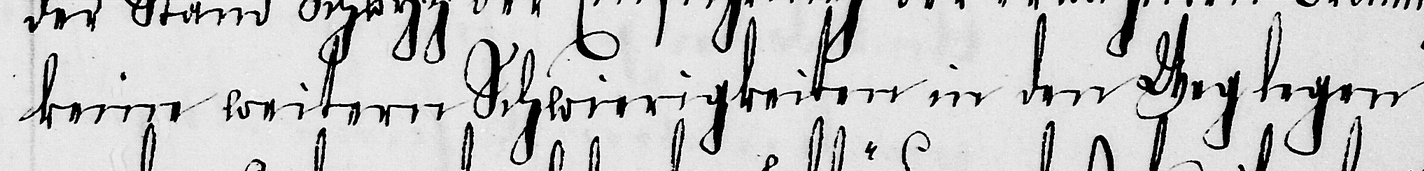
keine weitern Schwierigkeiten in den Weg legen
